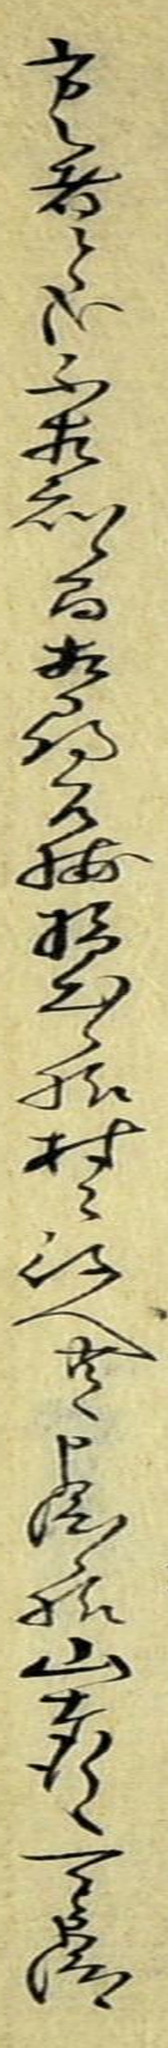方之者ニ候哉不相知候間相尋召捕指出候様村々役人共へ申渡候様山奉行へ可被申渡候
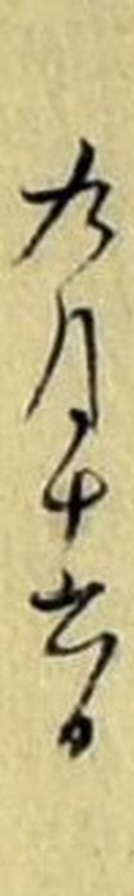九月十六日

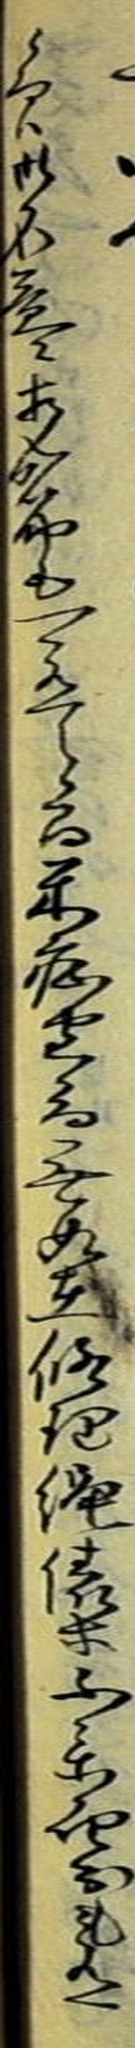候而ハ御不益ニ相成筋も可有之候間米症宜候而無如在修理縄俵等不参届分も有

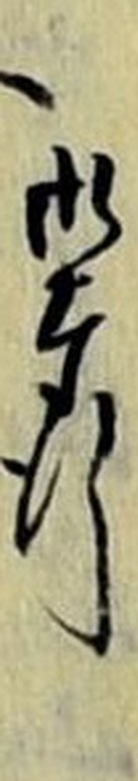御奉行
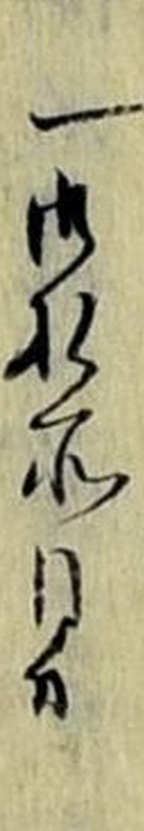御札所目付
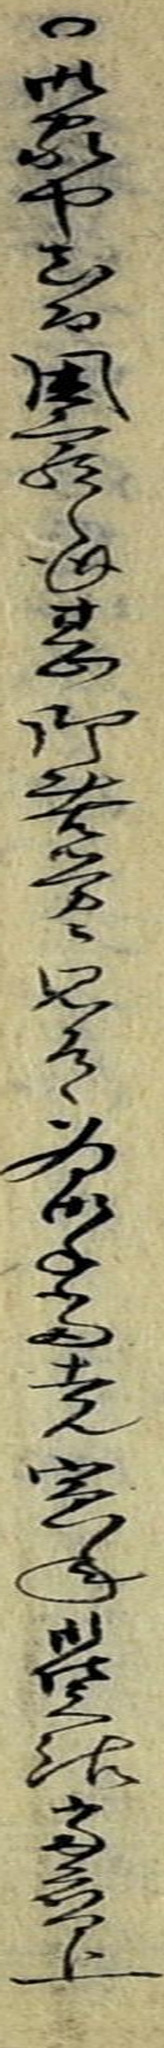〇御家中至而困窮之趣甚御苦労ニ思召候為御手当去ル寅年御貸銀当暮上
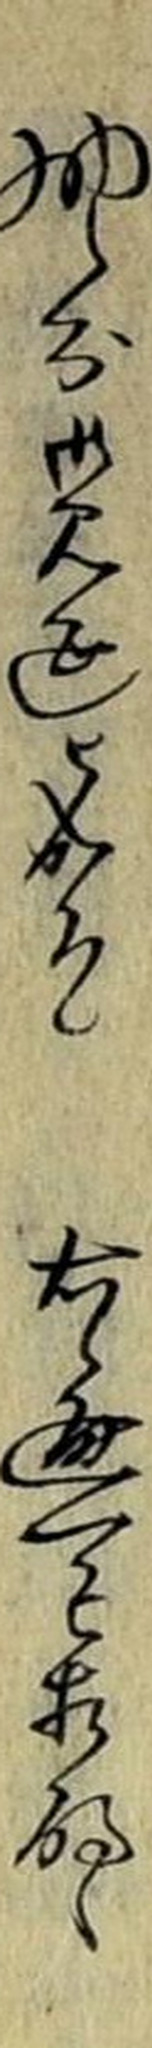納之分御見延被成下候右之通可被相触候
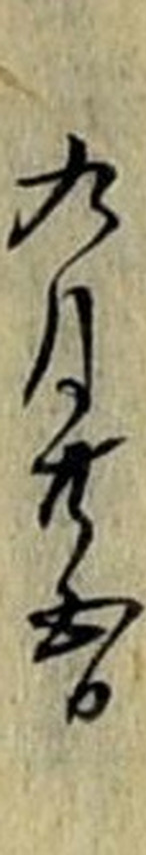九月廿五日
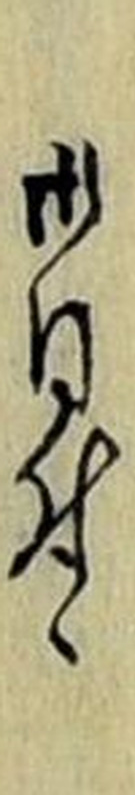御目付へ
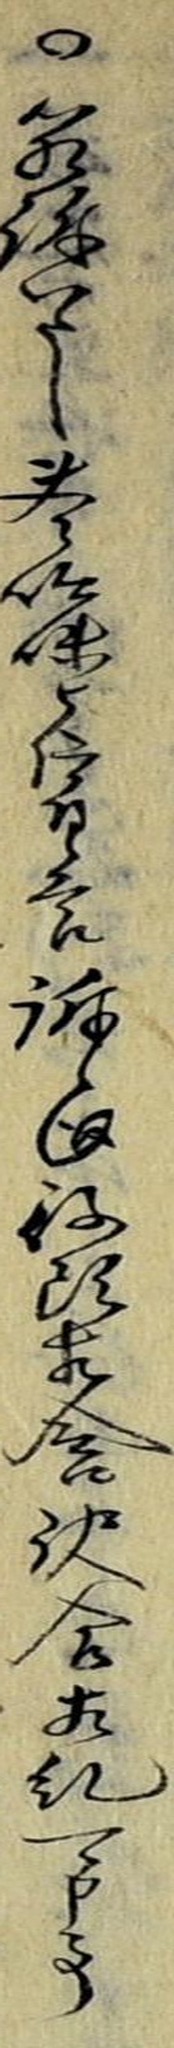〇箱訴いたし夫々吟味被仰付候節訴候趣役頭相含訳合相糺可申事
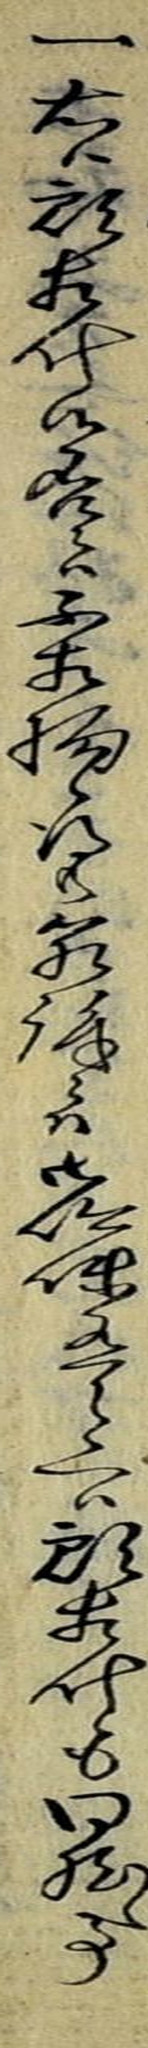一右ハ願相叶候否ニハ不相拘候得共箱訴ニ付御吟味有之候へハ願相叶も同然之事
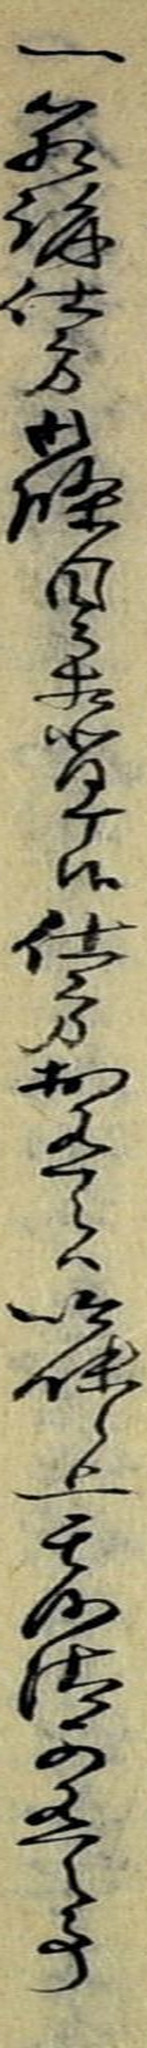一箱訴仕方御条目ニ相背ケ候仕方於有之ハ吟味之上其沙汰可有之事
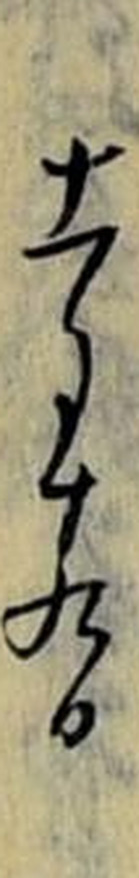十一月廿日
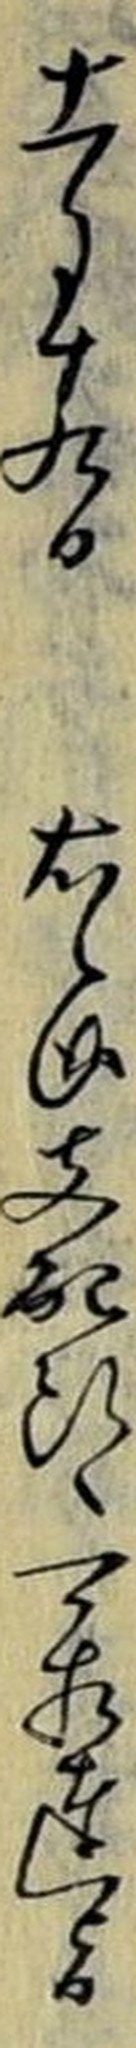十一月十九日右之趣支配頭へ可相達旨
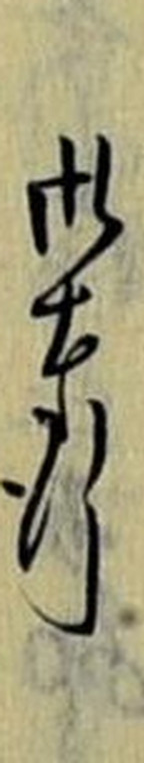御奉行
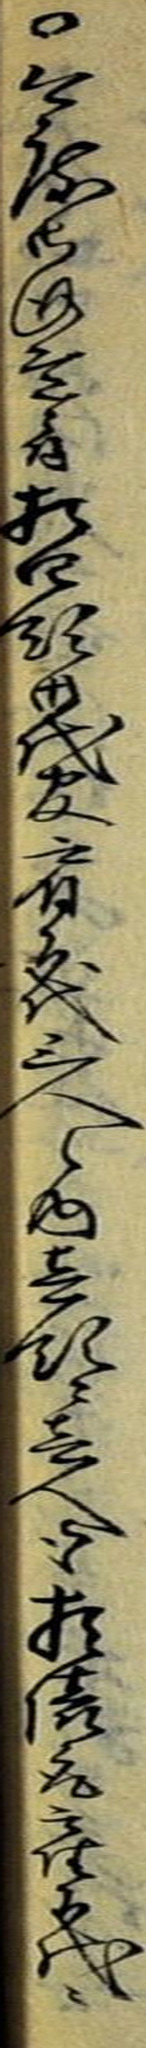〇今度御趣意ニ付拾四領御代官雇下代三人之内壱領ニ壱人ツヽ拾俵取雇下代ニ
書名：命令之部 三
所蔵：福井県文書館 Fukui Prefectural Archives
